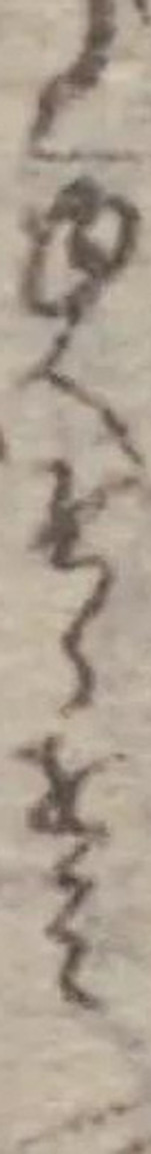ゆへそらをみ
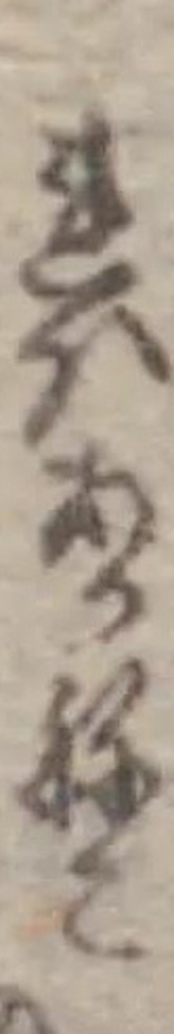れはあかねこ
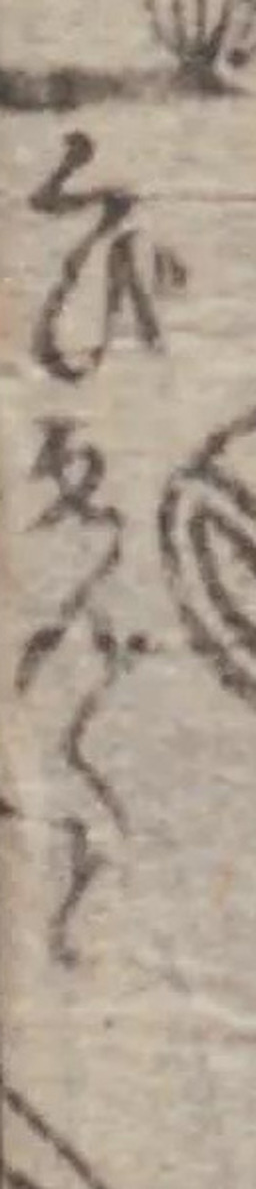のくびゑん〳〵と
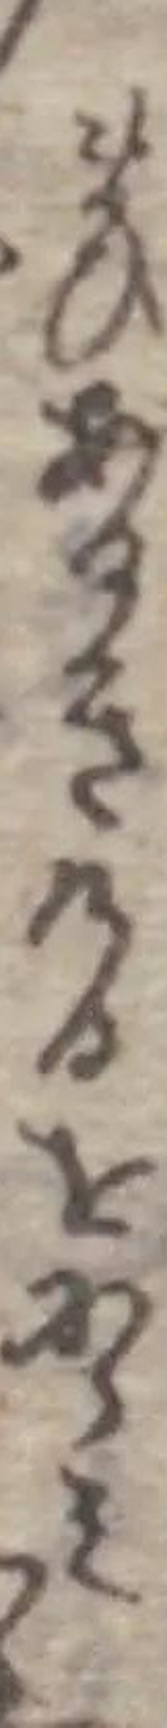まひあるきけるをにらみ
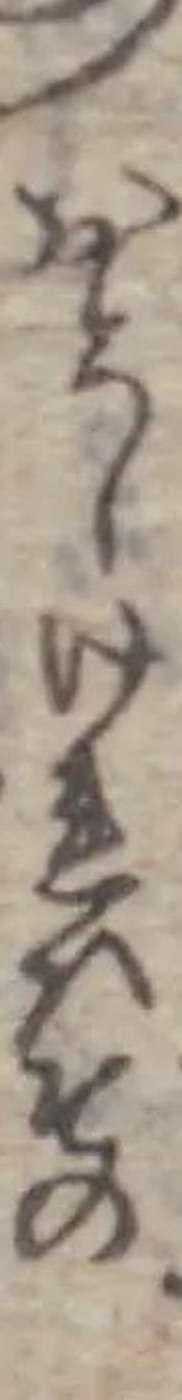おとしけれはその
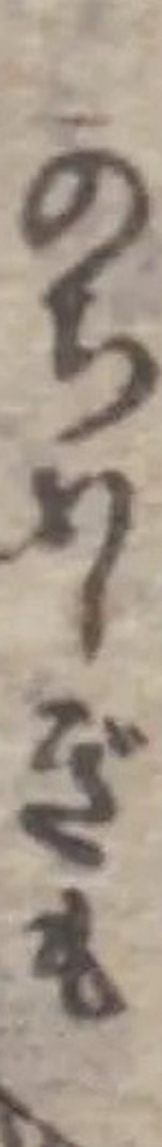のちふしぎも
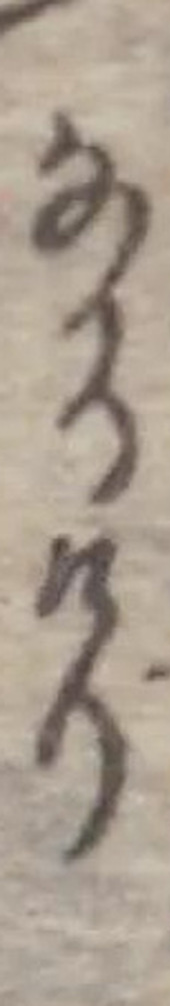なかりけり
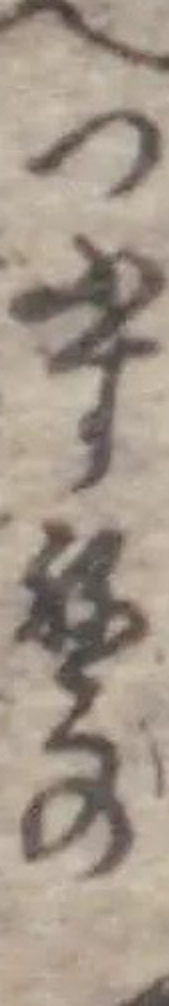つふすねこの
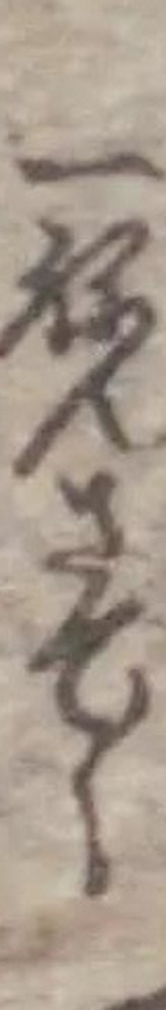一ねんさて〳〵
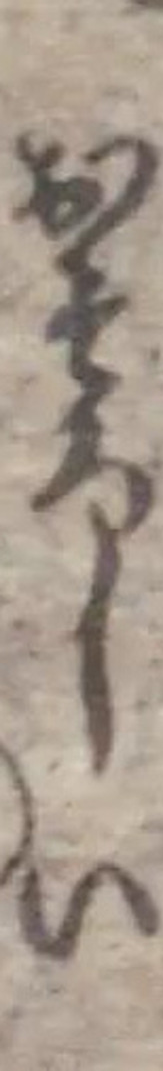おそろしい
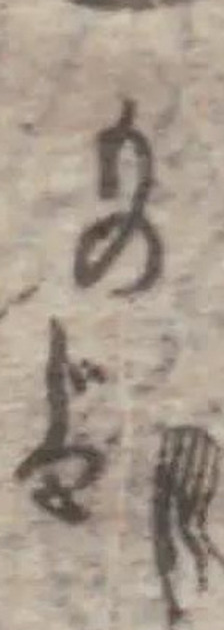ものじや

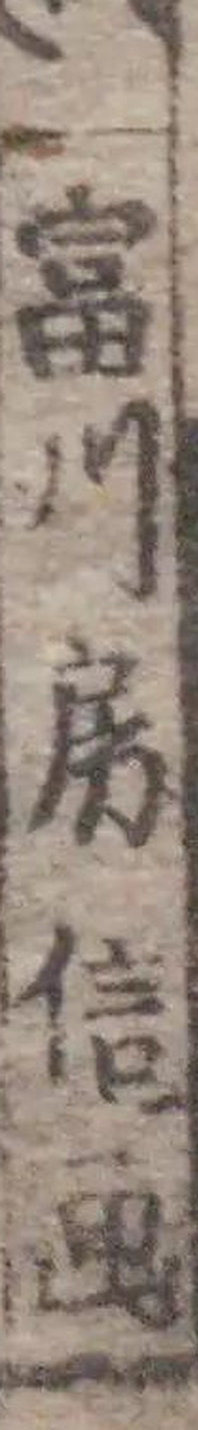富川房信画
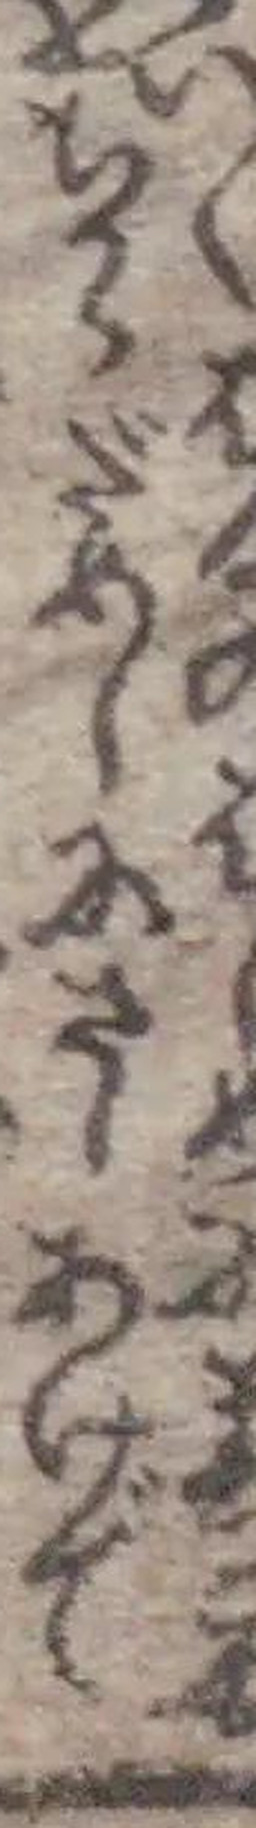をちからだめしにさしあげて
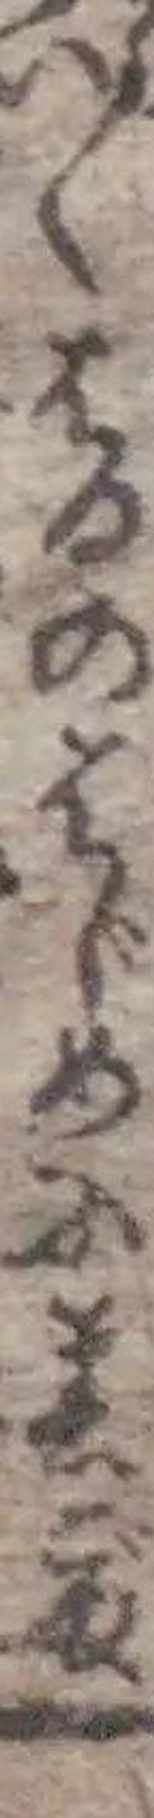たい〳〵はるのはじめに春ごま
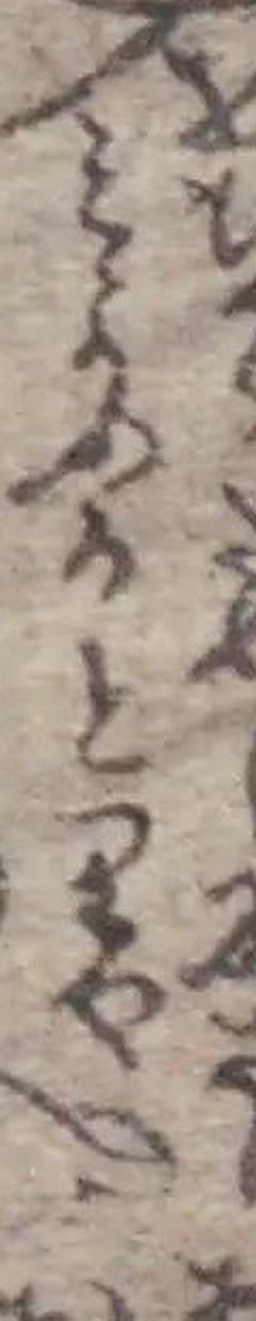みよふかとりや
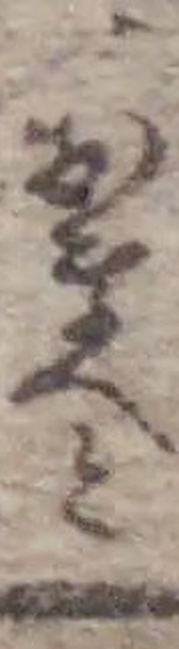おまへと
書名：鎌田又八 2巻
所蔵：国立国会図書館 National Diet Library, JAPAN
